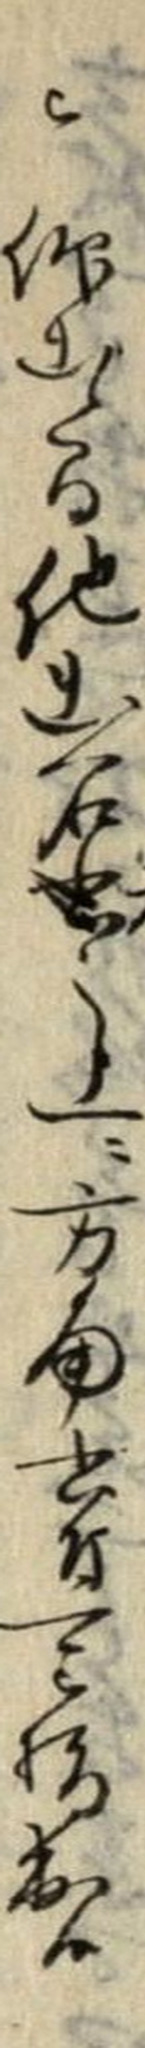被仰出候間他出名元之上に方角書付可被指出候
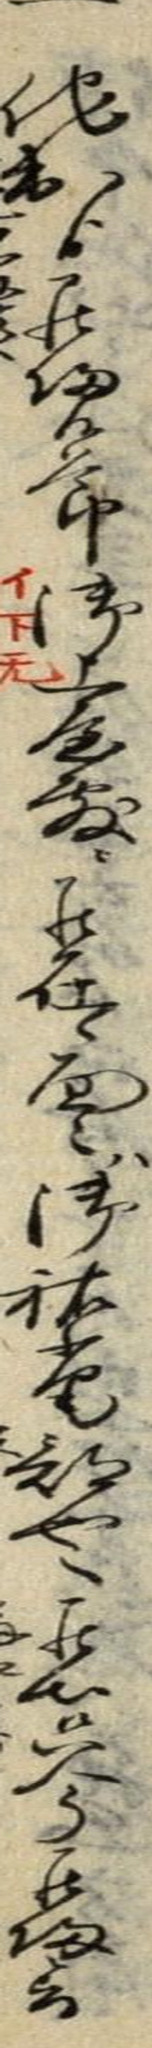一他出ゟ罷帰候節御上屋敷に罷在候面々は御祐筆部やへ罷出只今罷帰候旨
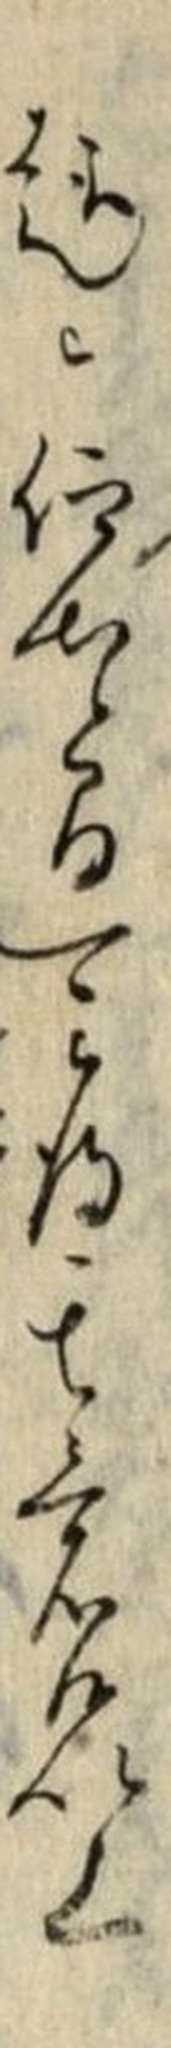趣被仰出候間可被得其意候以上
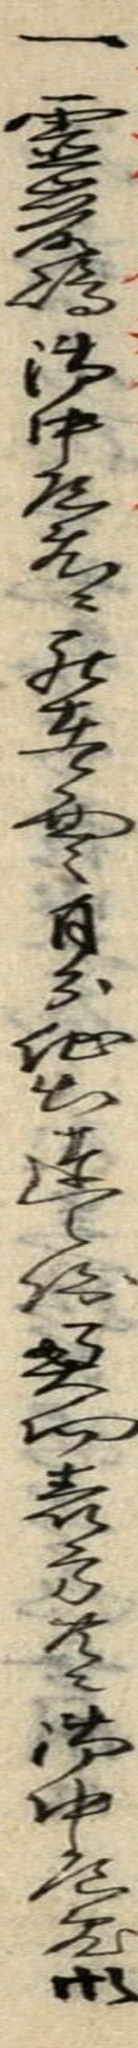一霊岸嶋御中屋敷に罷在候面々自分他出達之儀奥向表方共に御中屋敷御
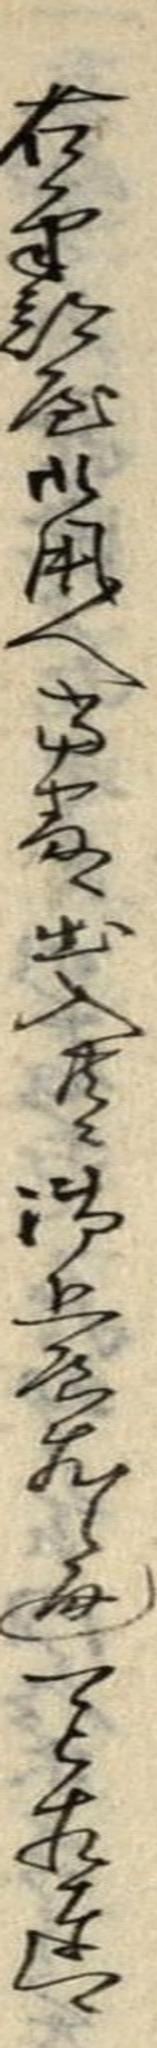右筆部屋御用人当番へ出入共に御上屋敷之通可被相達候
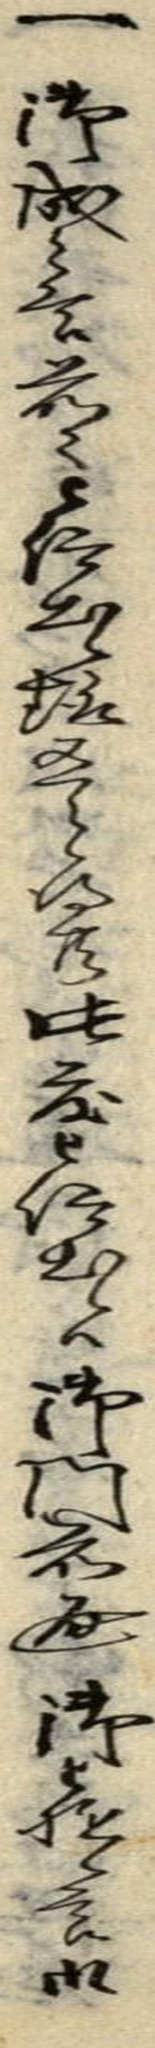一御成之節前々被仰出候趣有之候得共此度被仰出候は御門前通御被遊候節御
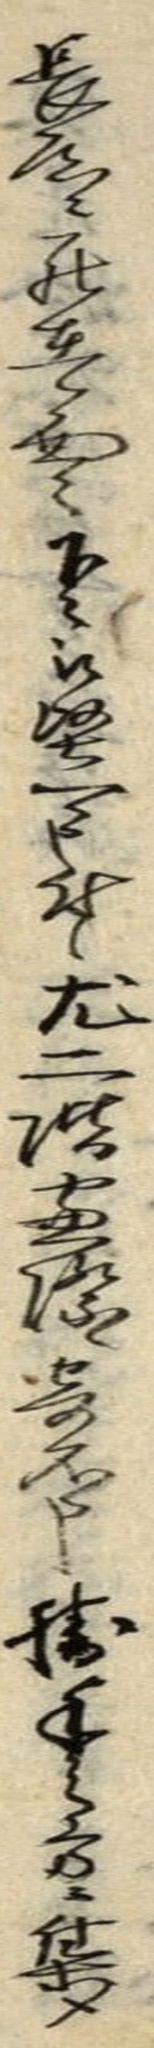長屋に罷在候面々下々江堅可申付候尤二階窓際へ寄不申勝手之方に集め
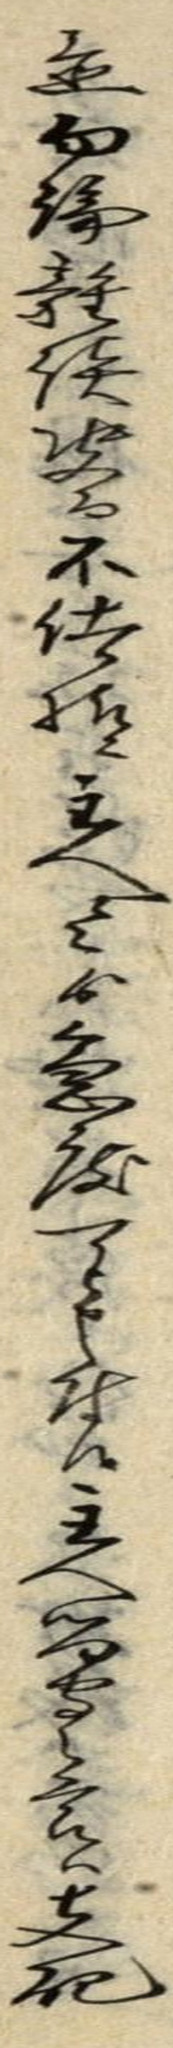置勿論雑談決て不仕候様に主人々々ゟ急度可被申付候主人留守之節は支配

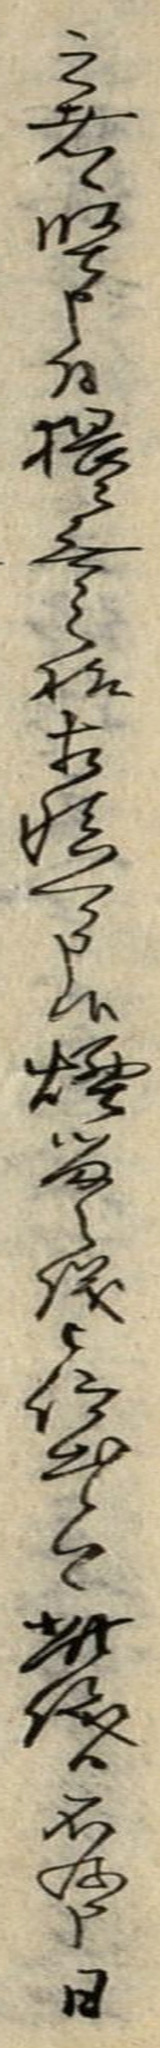之者へ堅申付猥に無之様相慎可申候煙留之儀被仰出候はゝ此儀は不及申日
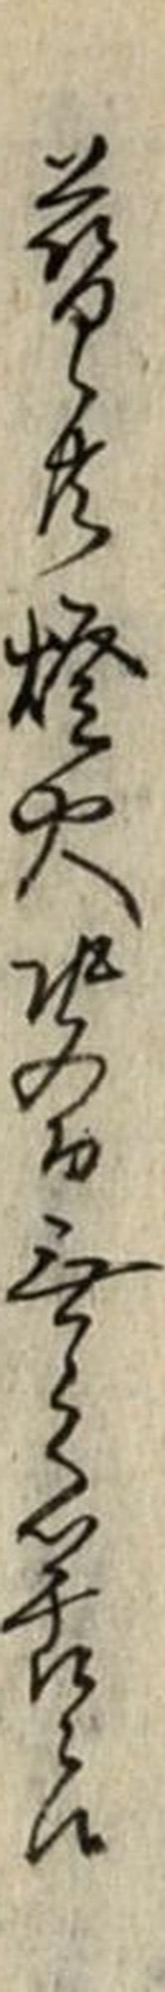暮候共燈火決て無之筈に候
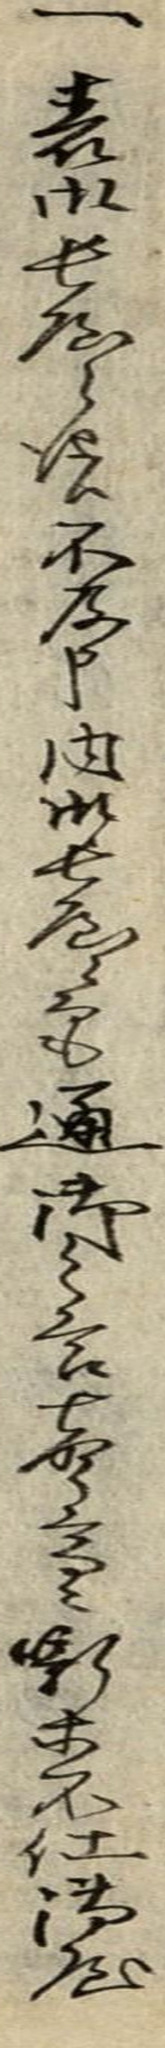一表御長屋之儀は不及申内御長屋にても通御之節声高に噺等不仕御屋
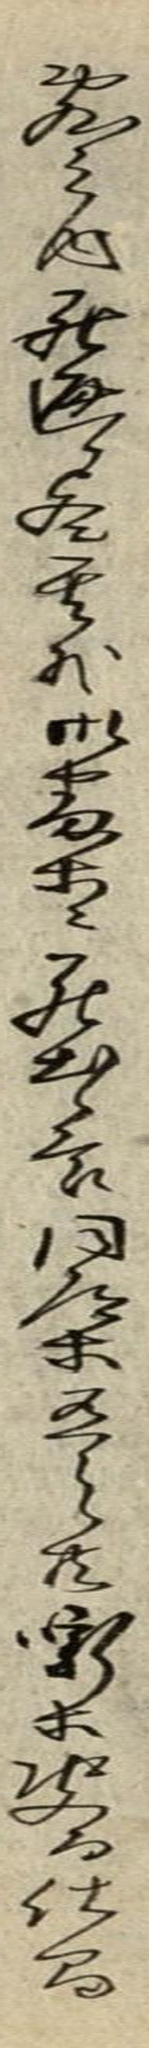敷之内罷通候歟其外御番等に罷出候節同道等有之共噺等決て仕間
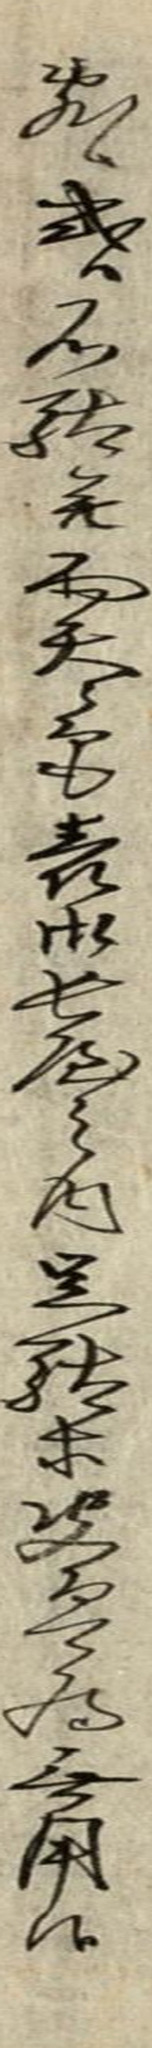敷候或は不駄并雨天にても表御長屋之内足駄等決て可為無用候
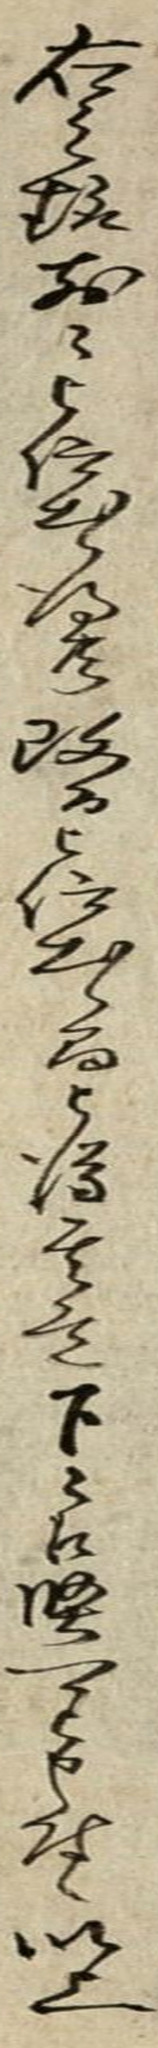右之趣前々被仰出候得共改て被仰出候間被得其意下々江堅可被申付候以上
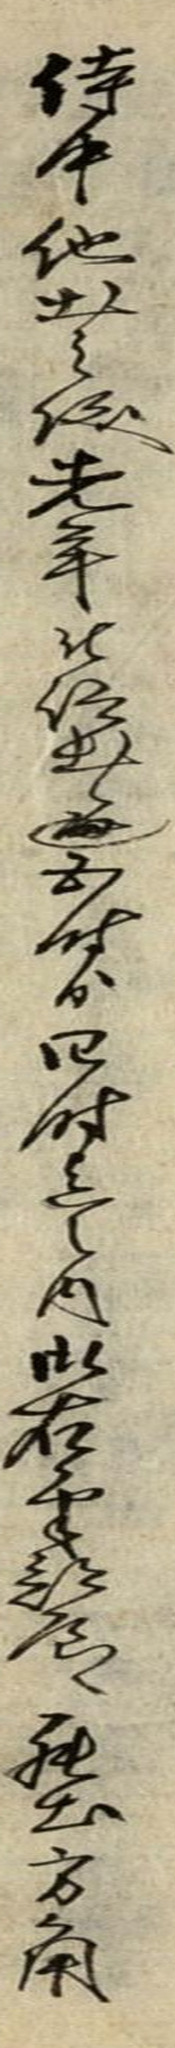侍中他出之儀先年被仰出候通五時ゟ四時迄之内御右筆部屋へ罷出方角
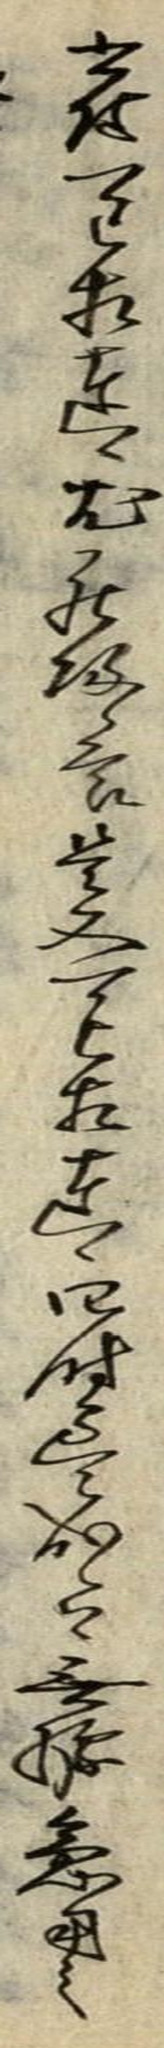書付可被相達候尤罷帰候節是又可被相達候四時過に成候はゝ無據急用之
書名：三都并道中之部
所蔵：福井県文書館 Fukui Prefectural Archives
